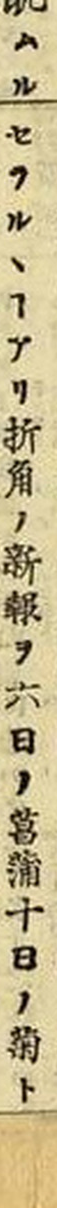セラルヽヿアリ折角ノ新報ヲ六日ノ菖蒲十日ノ菊ト
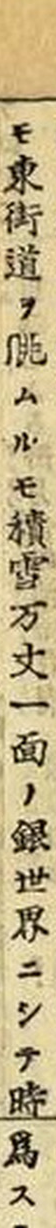モ東街道ヲ眺ムルモ積雪万丈一面ノ銀世界ニシテ時
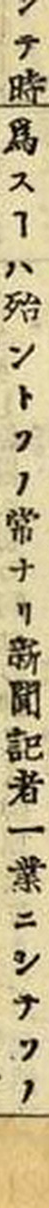爲スヿハ殆ントソノ常ナリ新聞記者一業ニシテソノ
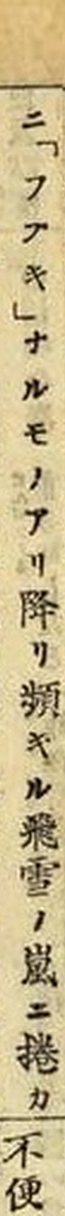ニ「フブキ」ナルモノアリ降リ頻キル飛雪ノ嵐ニ捲カ
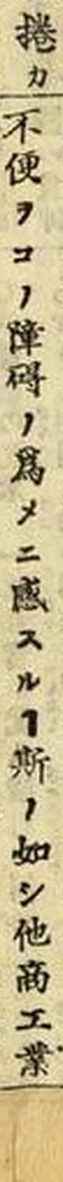不便ヲコノ障碍ノ爲メニ感スルヿ斯ノ如シ他商工業
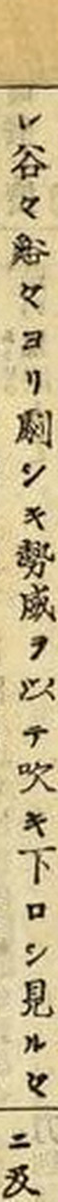レ谷々渓々ヨリ劇シキ勢威ヲ以テ吹キ下ロシ見ル々
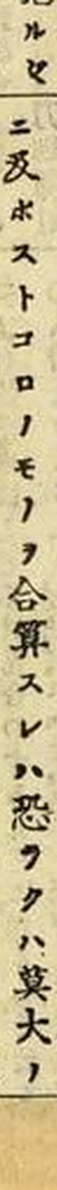ニ及ボストコロノモノヲ合算スレハ恐ラクハ莫大ノ
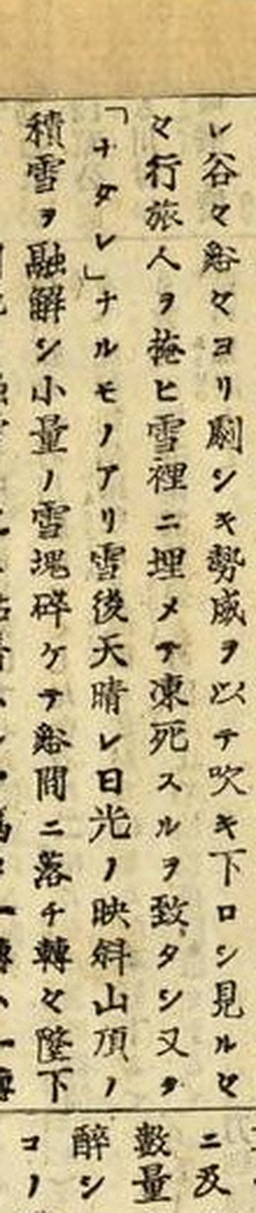「ナダレ」ナルモノアリ雪後天晴レ日光ノ映斜山頂ノ
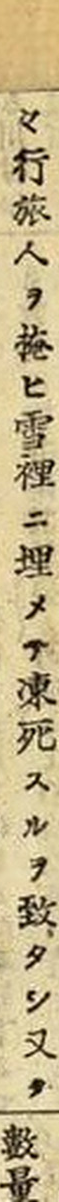々行旅人ヲ掩ヒ雪裡ニ埋メテ凍死スルヲ致タシ又タ
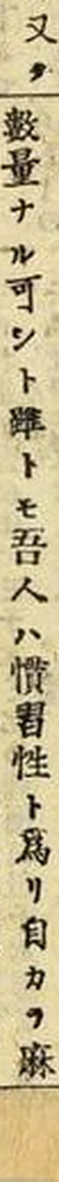數量ナル可シト雖トモ吾人ハ慣習性ト爲リ自カラ麻
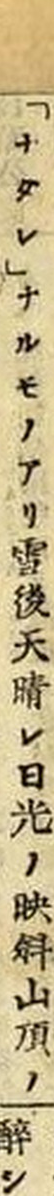「ナダレ」ナルモノアリ雪後天晴レ日光ノ映斜山頂ノ
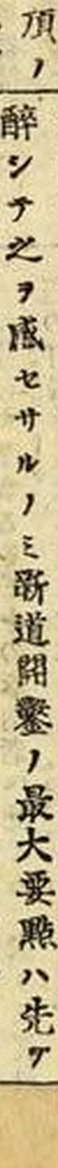醉シテ之ヲ感セサルノミ新道開鑿ノ最大要點ハ先ズ
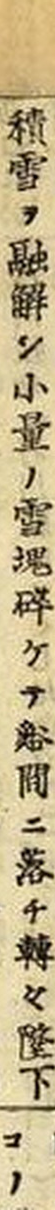積雪ヲ融解シ少量ノ雪塊碎ケテ渓間ニ落チ轉々降下
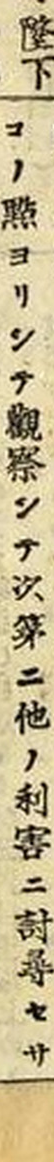コノ點ヨリシテ観察シテ次第ニ他ノ利害ニ討尋セサ
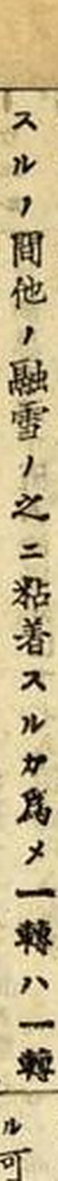スルノ間他ノ融雪ノ之ニ粘着スルガ爲メ一轉ハ一轉
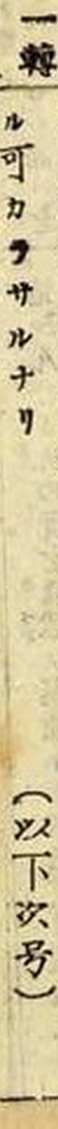ル可カラサルナリ以下次号
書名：温古集 五巻
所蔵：福井県文書館 Fukui Prefectural Archives
